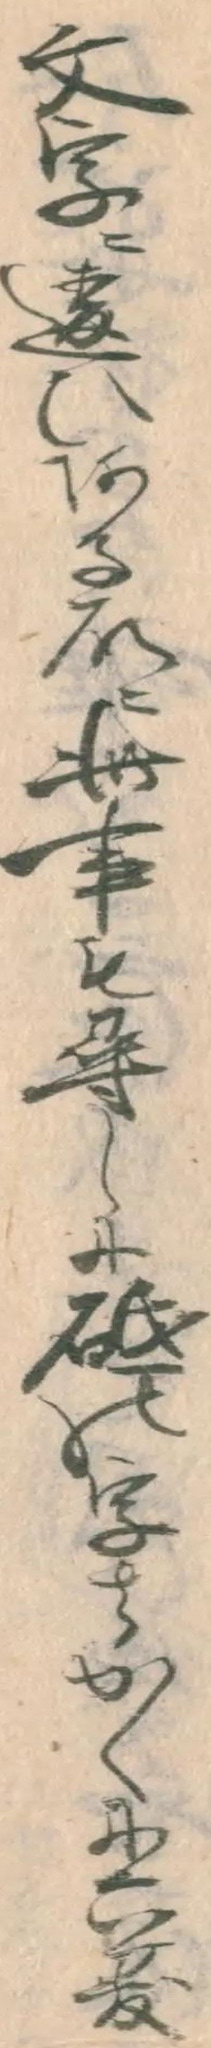文字に違ひある故に此事も尋しに砥の字はかくに六ヶ敷
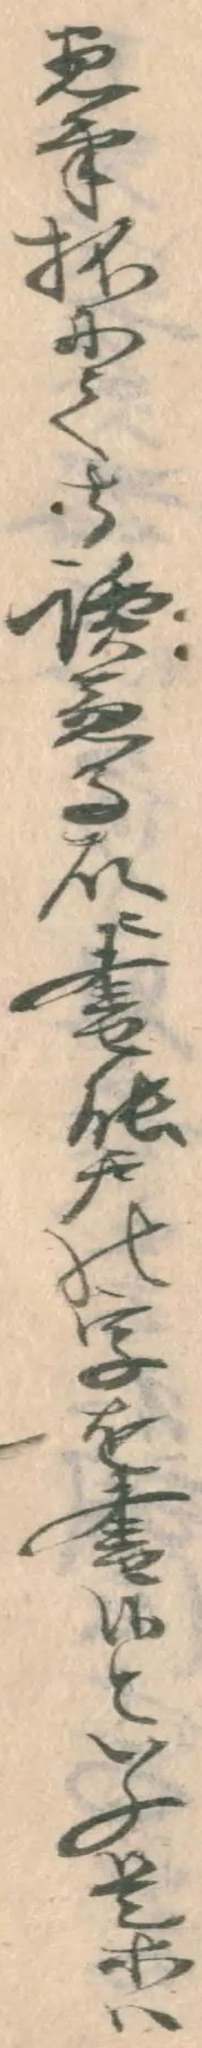愚筆抔にては読兼る故に書能戸の字を書候といふ是等は
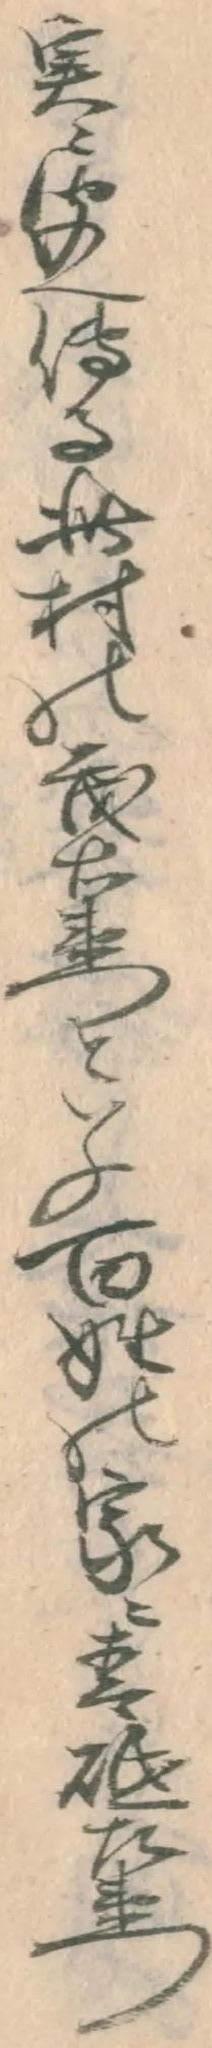実に聞へ侍る此村の茂右衛門といふ百姓の家に青砥左衛門

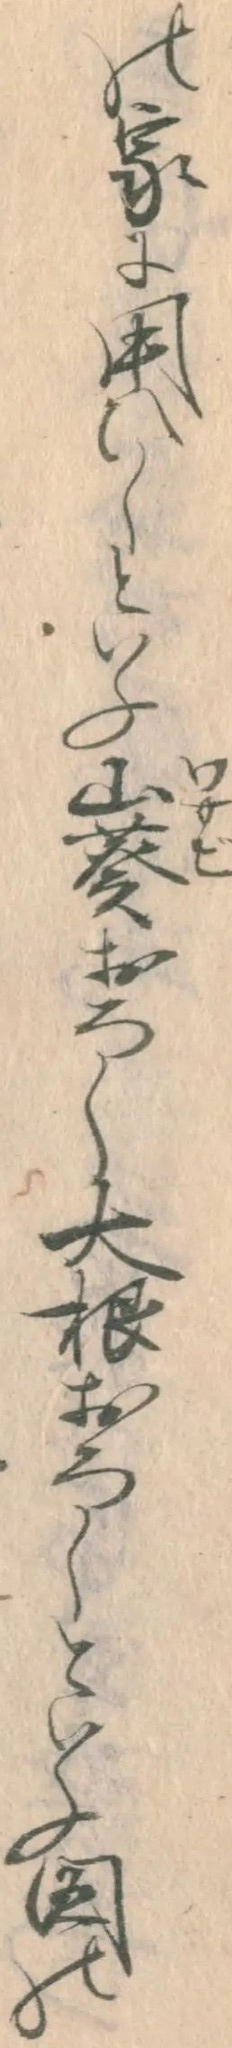の家に用ひしといふ山葵おろし大根おろしといふ図の
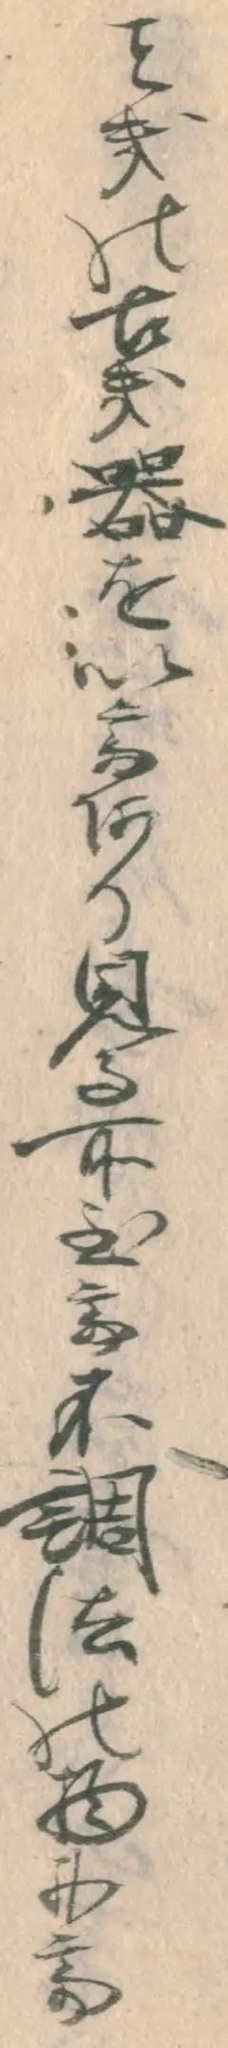こときの古き器を以てあり見る所至て不調法の物にて
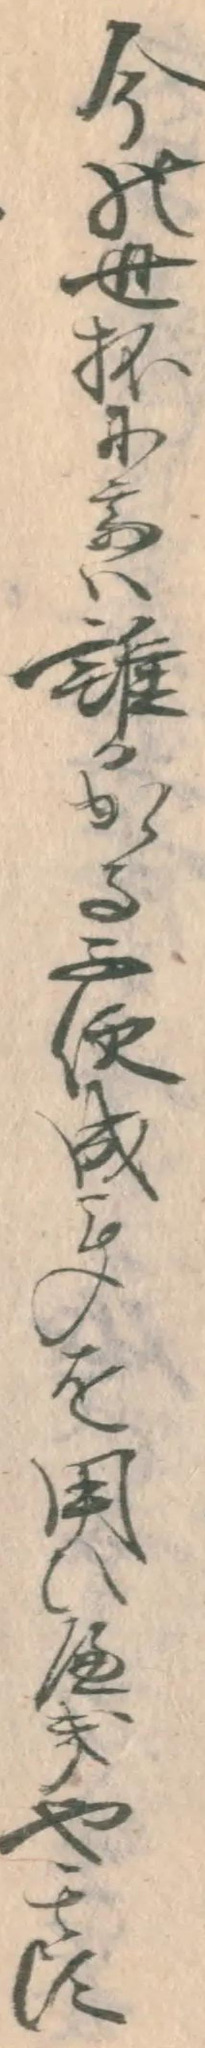今の世抔にては誰かかゝる不便成ものを用ひへきや其頃
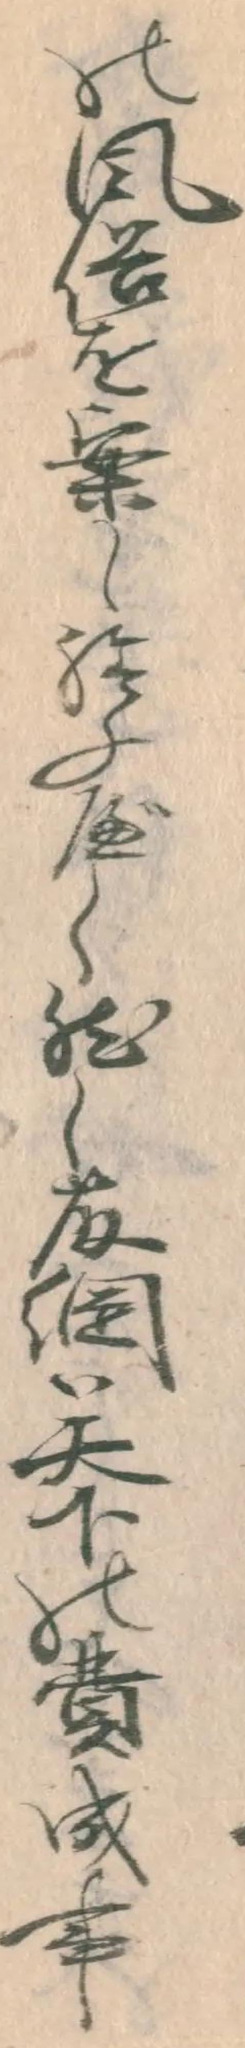の風俗を案し給ふべし然し藤綱は天下の費成事
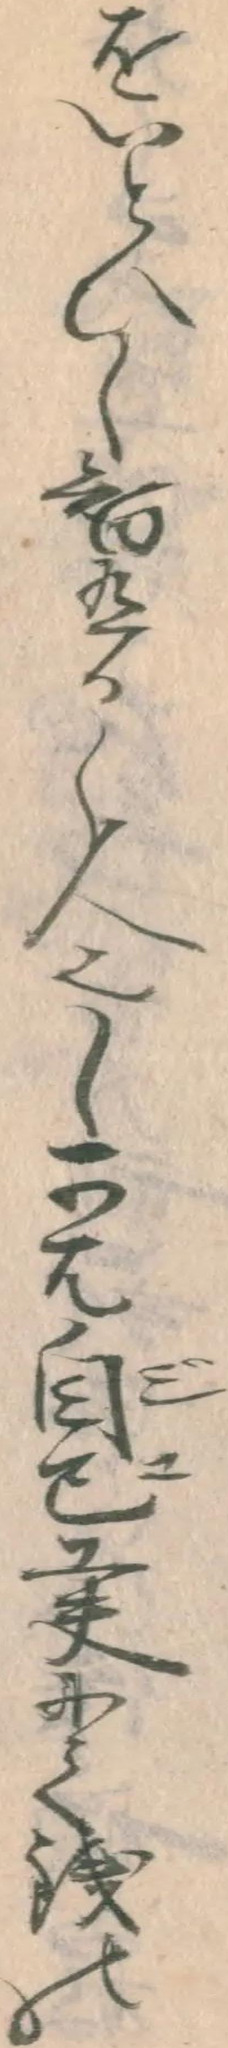をいとひし智有りし人也しかは自己工夫にて銭の
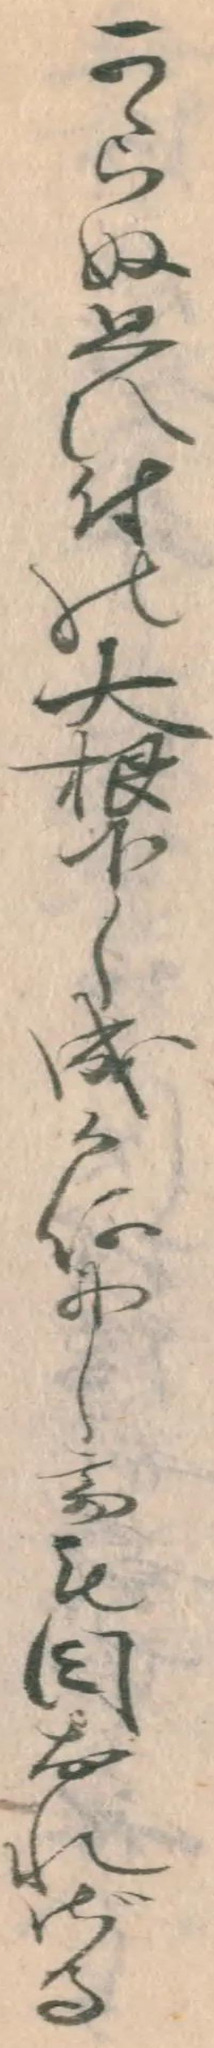かゝらぬ思ひ付の大根下し成か何にしても目おれざる
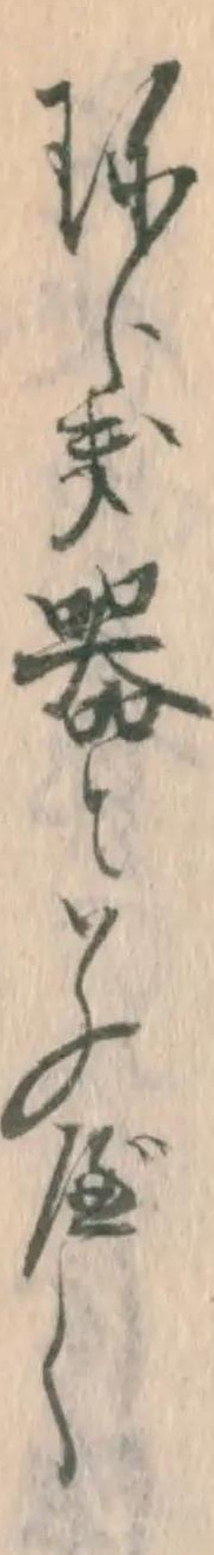珍らき器といふべし
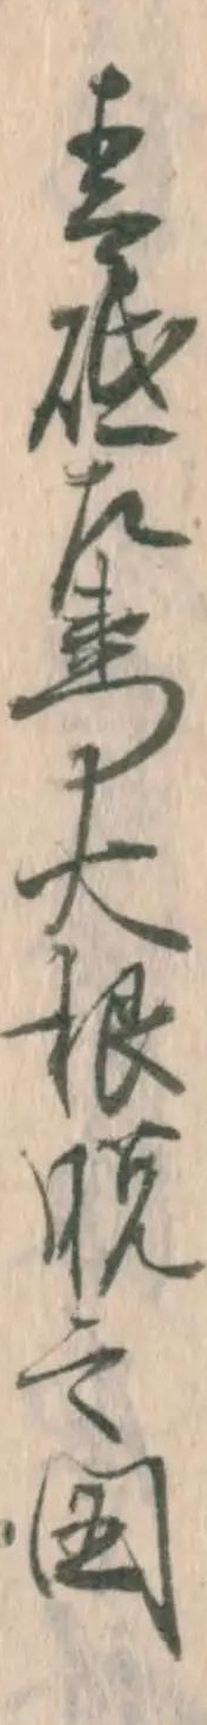青砥左衛門大根脱之図
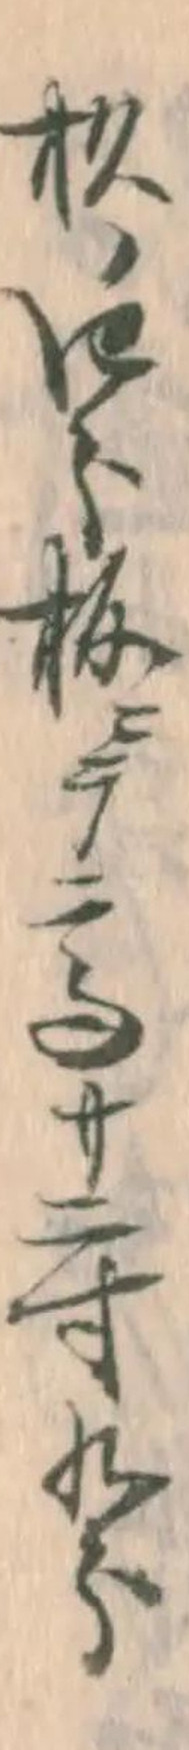杉ノ四分板ニテ高サ二寸九分
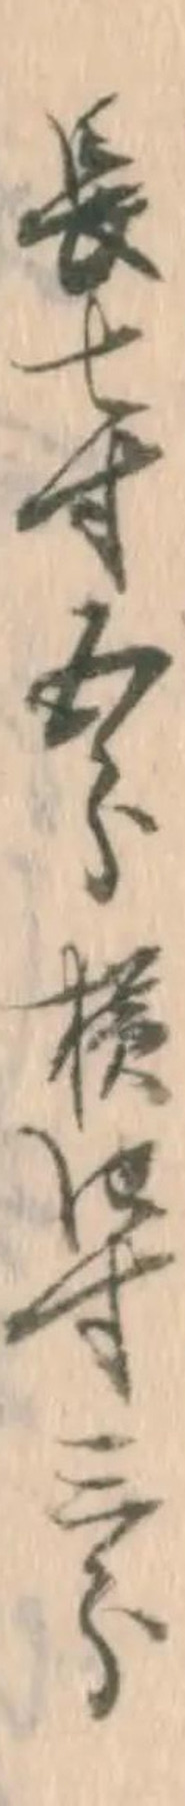長七寸五分横四寸三分
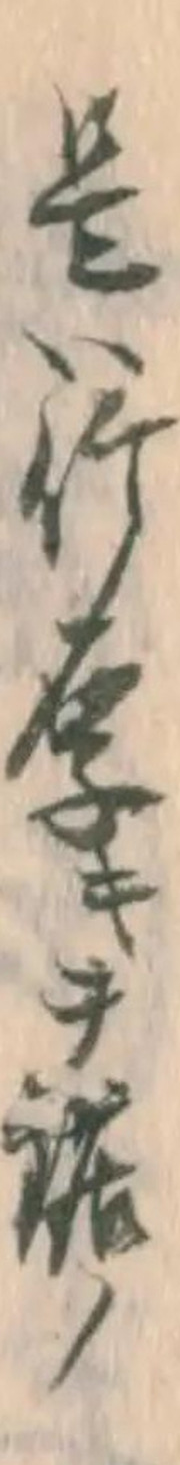是は竹厚キヲ鋸ノ
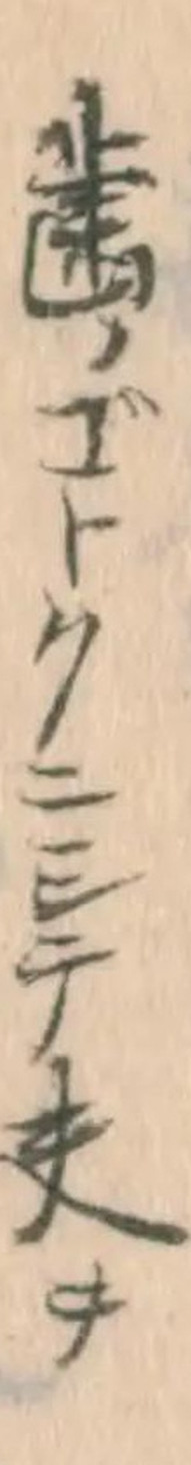歯ノゴトクニシテ夫ヲ
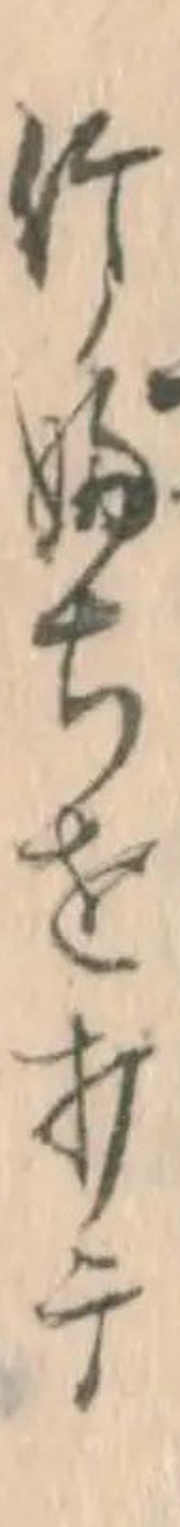竹ふちを打て
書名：四神地名録 6巻. [4]葛飾郡
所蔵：国立国会図書館 National Diet Library, JAPAN
